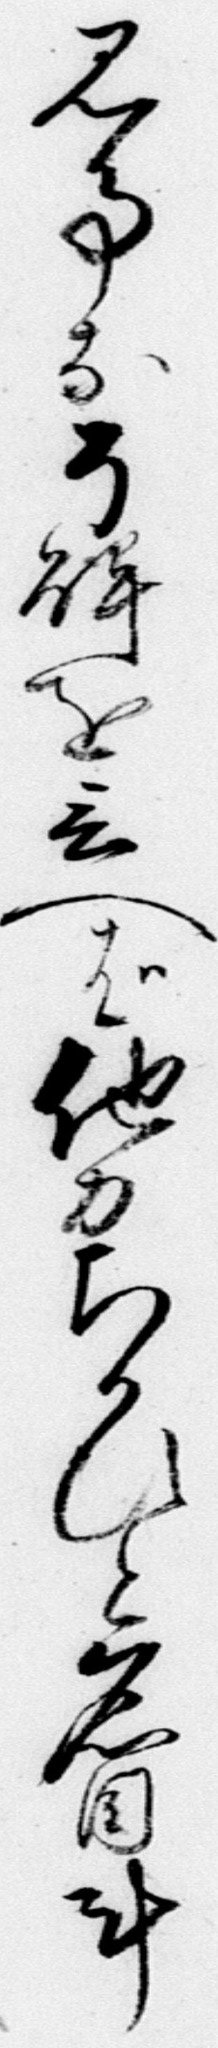見事な了解を言へば他力ちかひと名目計
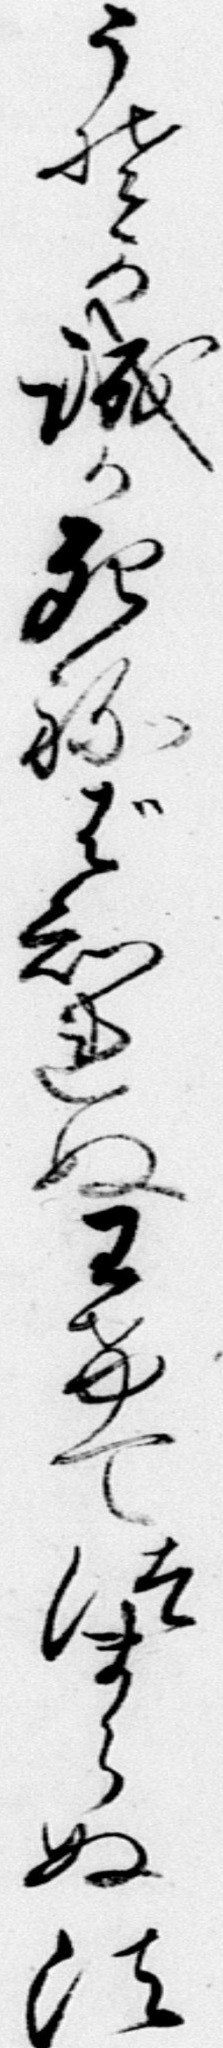うそか誠か死ねば知れぬわけてつまらぬ法
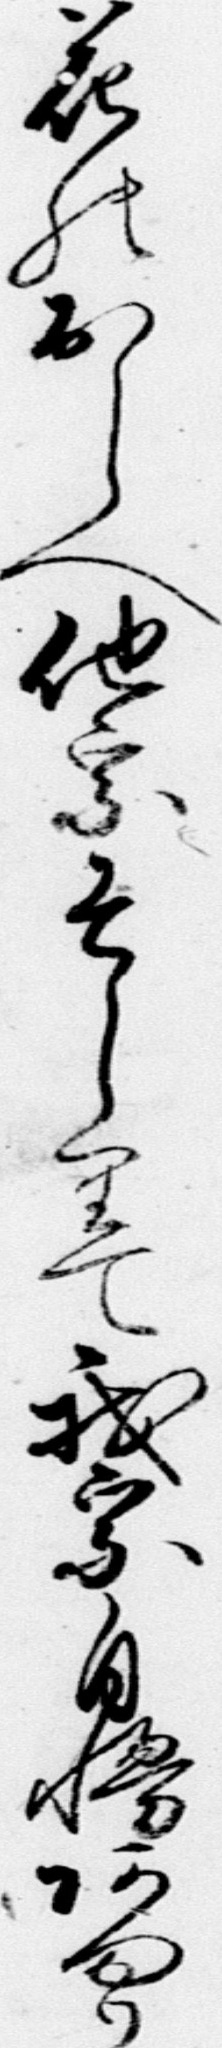花のおしへ他宗そしりて我宗自慢あまり
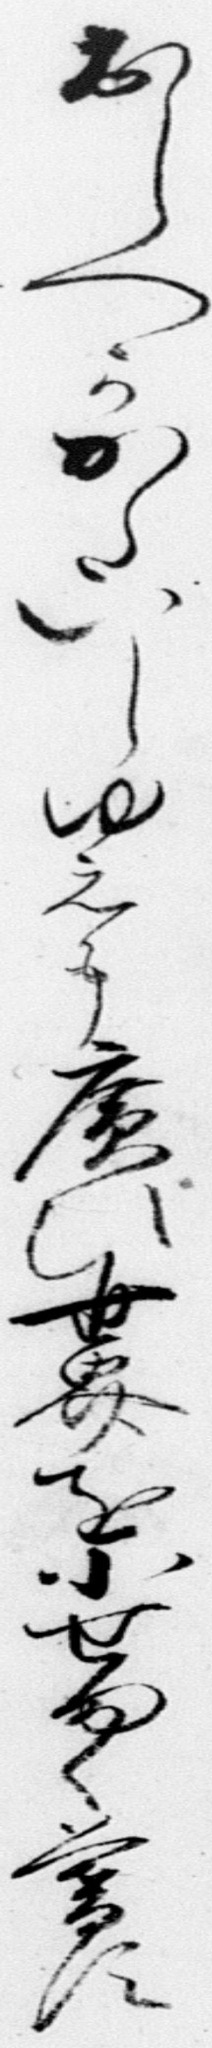おしへかかたいしゆえに広ひ世界を小せまく暮す
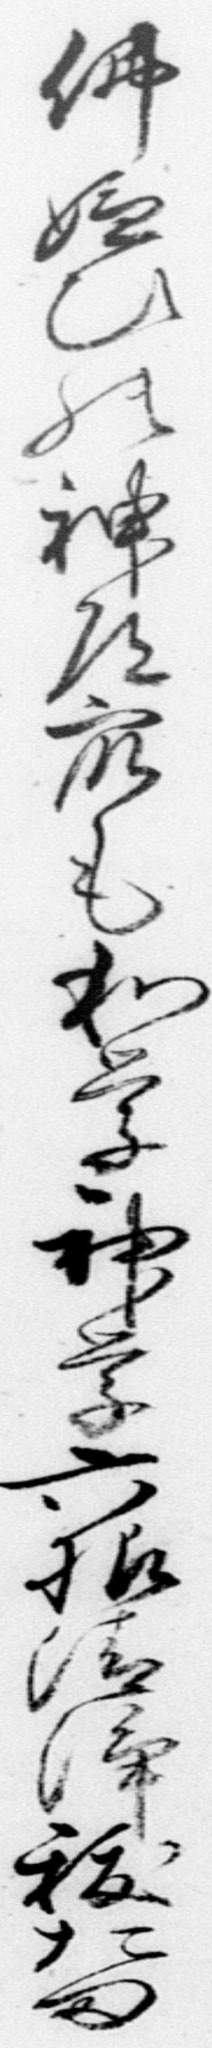仏嫌ひの神道衆も和学神学六根清浄祓たま
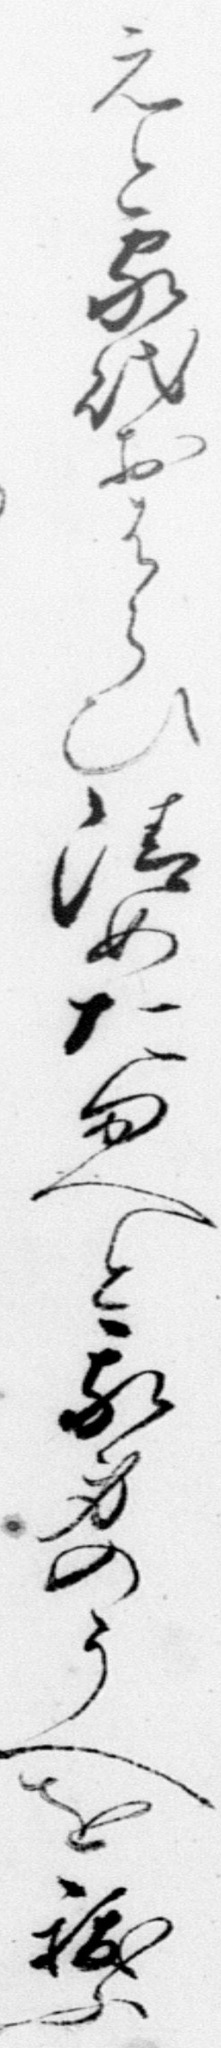えと家財おはらひ清めたまへと我身のうへを祓ふ
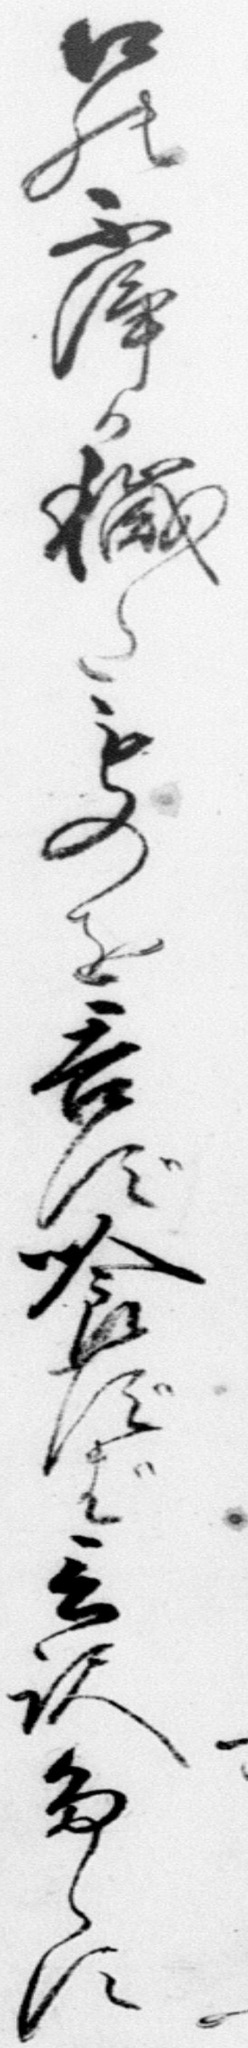口の不浄か穢たものを呑ず喰ずば言訳たらす
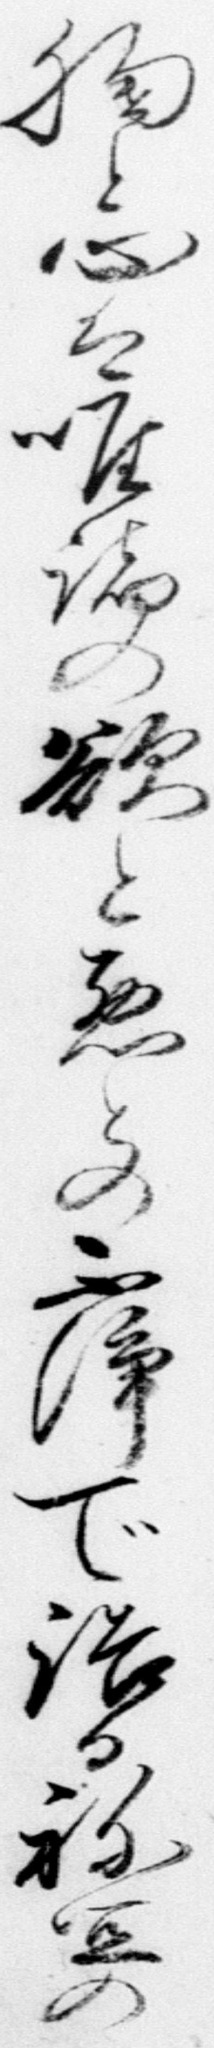胸と心は唯諸の欲と悪との不浄で詰る禰宜の
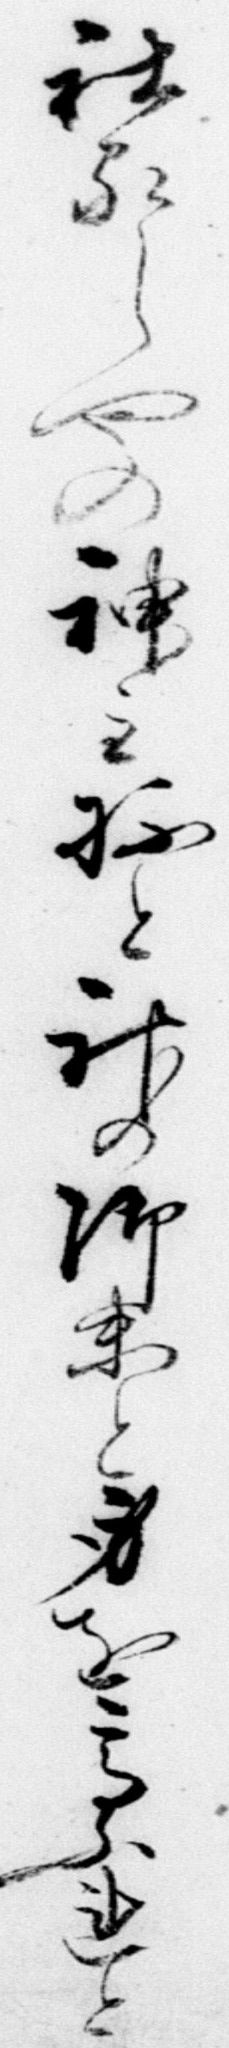社家しやの神主抔と神の御末と身を高ふれと
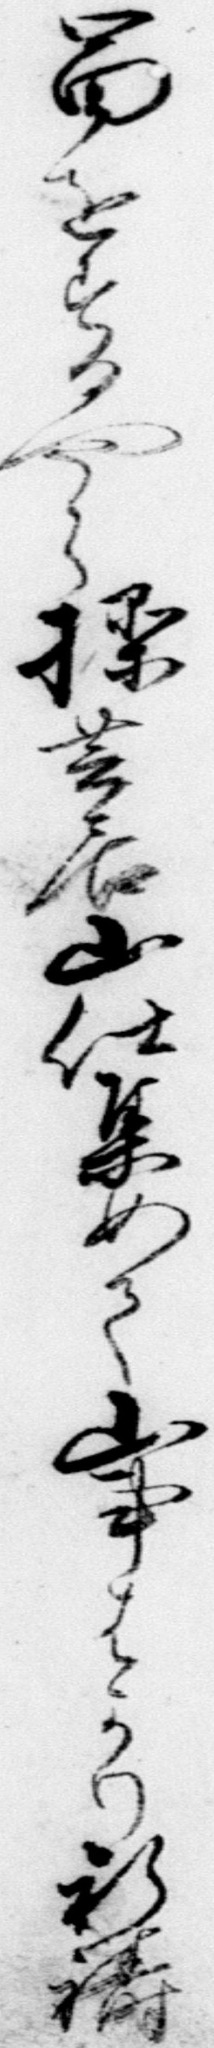富をするやら操芝居山仕集めて山事はかり祈祷

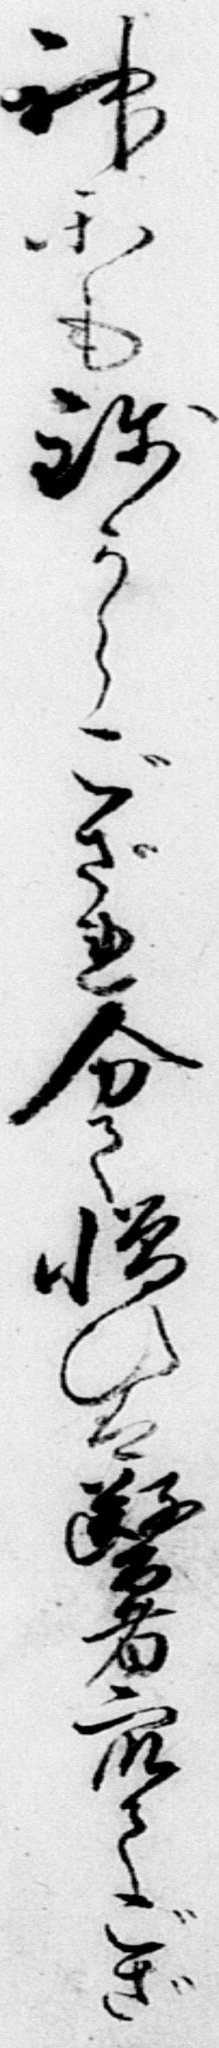神楽も銭からござれ分て憎ひは医者衆てござ
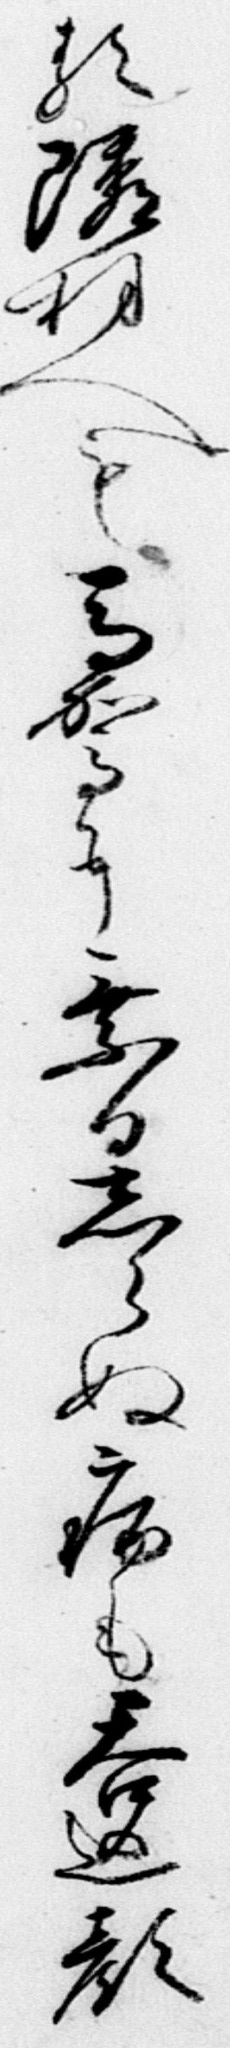る隣村へも馬駕に乗るしらぬ病も呑込顔
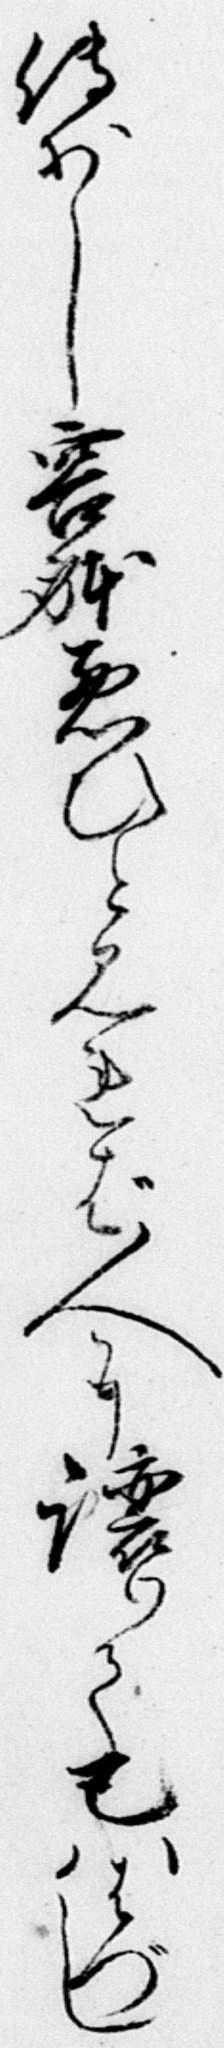て少し容体悪ひと見れば人に譲りて己ははづし
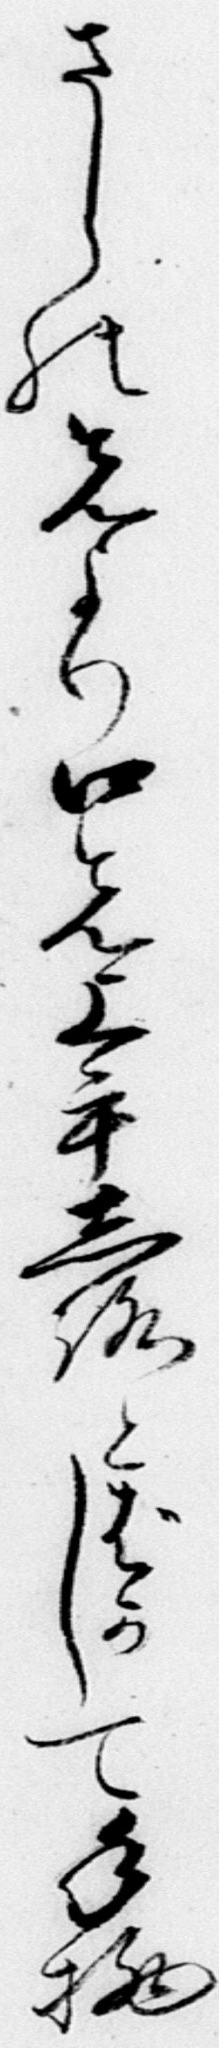さしの先より口先上手しろとばかして手柄
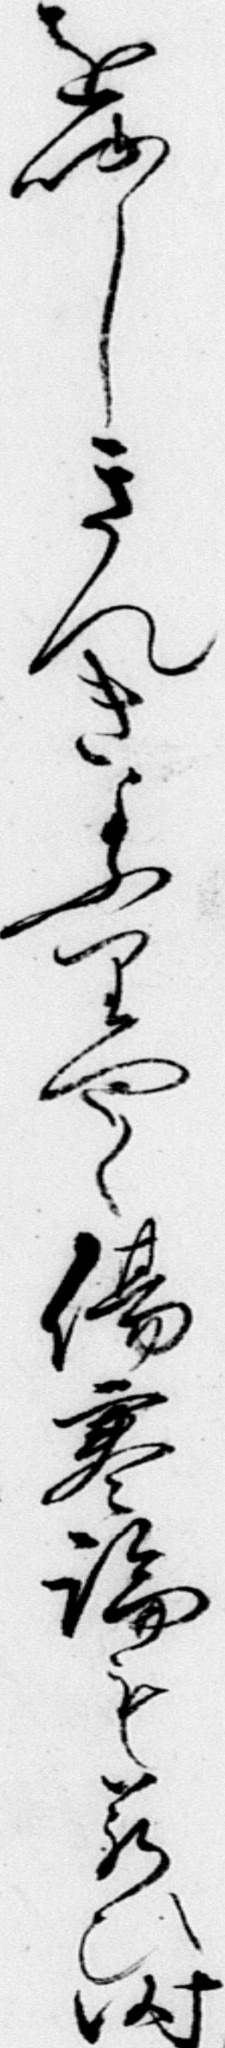を咄しきんきよふりやく傷寒論も若ひ時
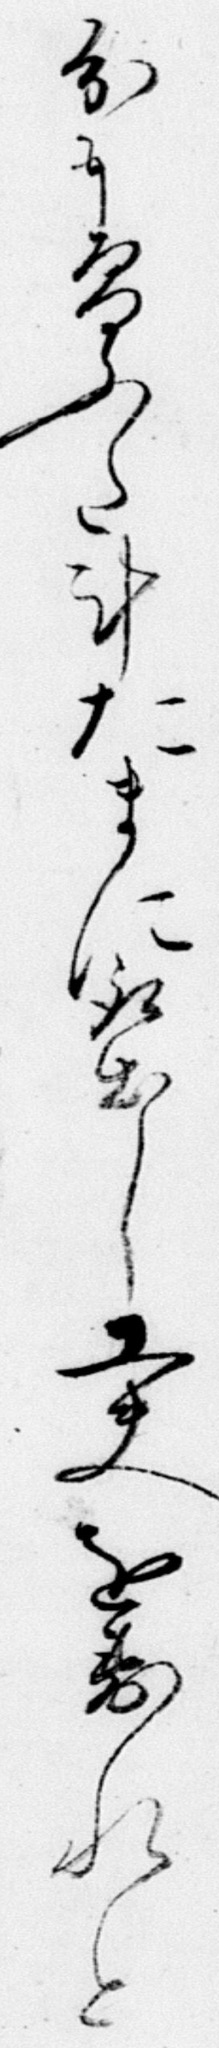分に習ふた計たまに取出し工夫をすれと
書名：越後地震由来
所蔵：徳島県立図書館
